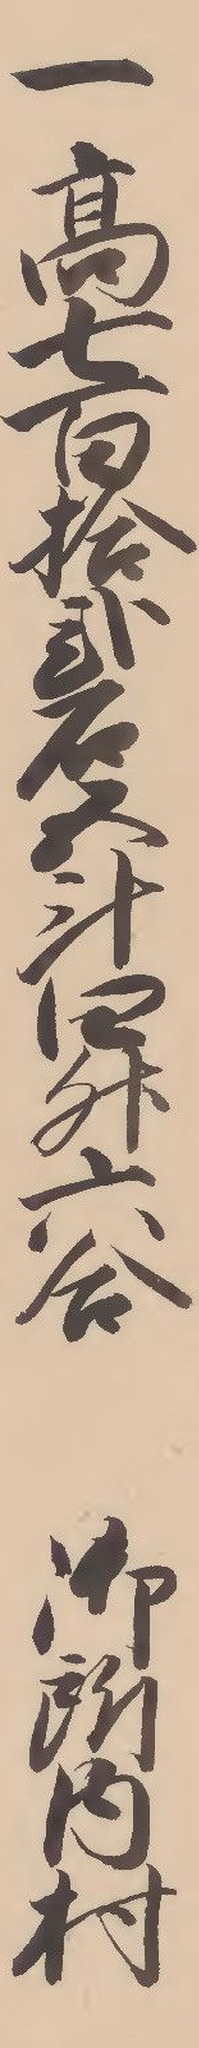一高七百拾弐石五斗四升六合御所内村
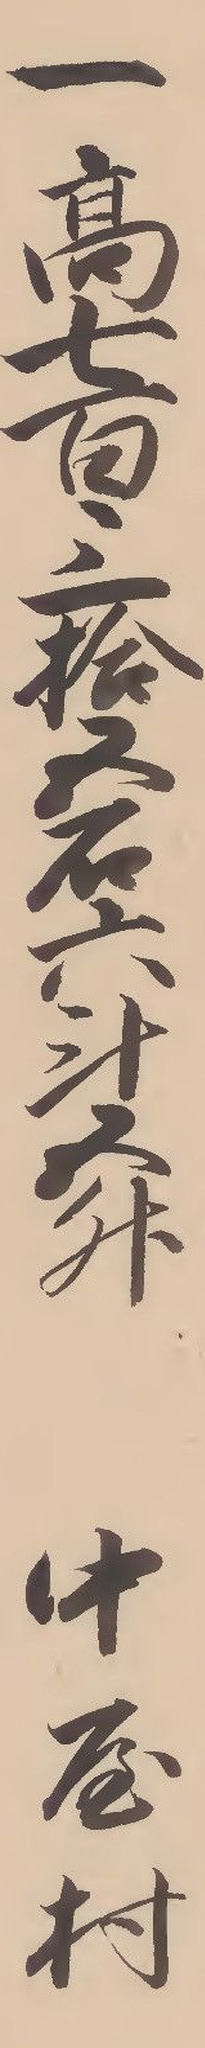一高七百三拾五石六斗五升中屋村
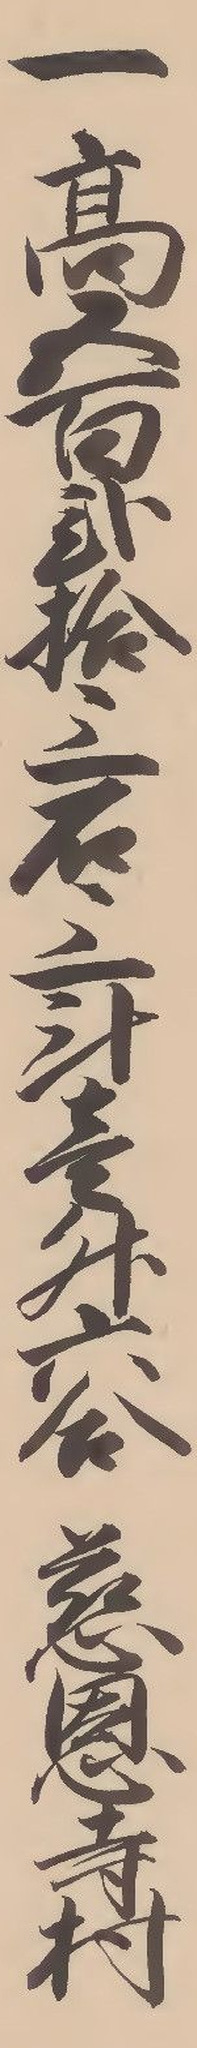一高五百弐拾三石三斗壱升六合慈恩寺村
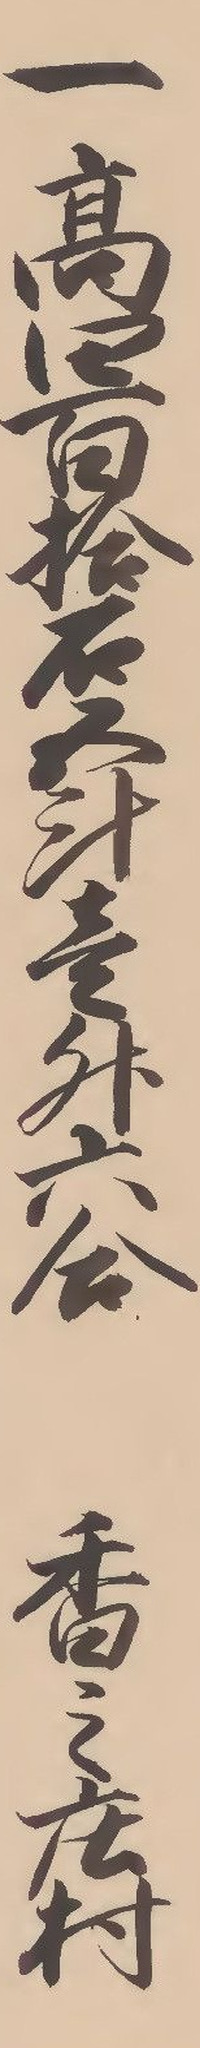一高四百拾石五斗壱升六合香之庄村
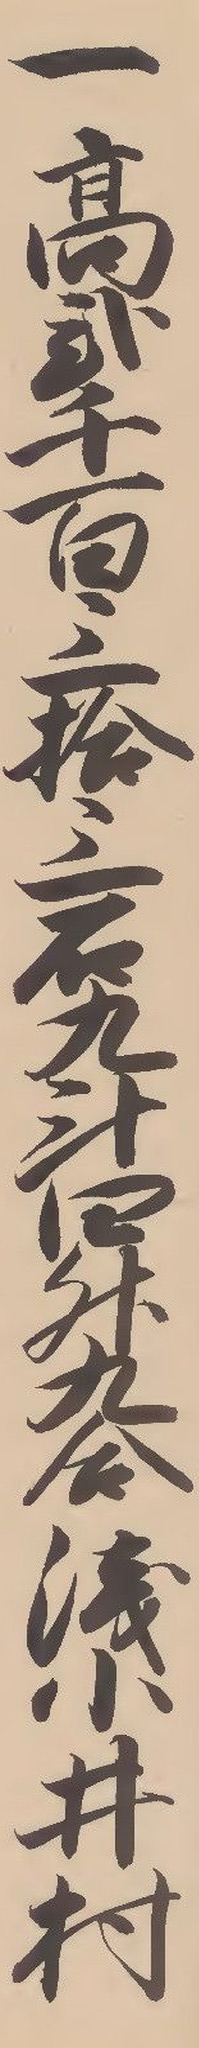一高弐千百三拾三石九斗四升九合浅小井村
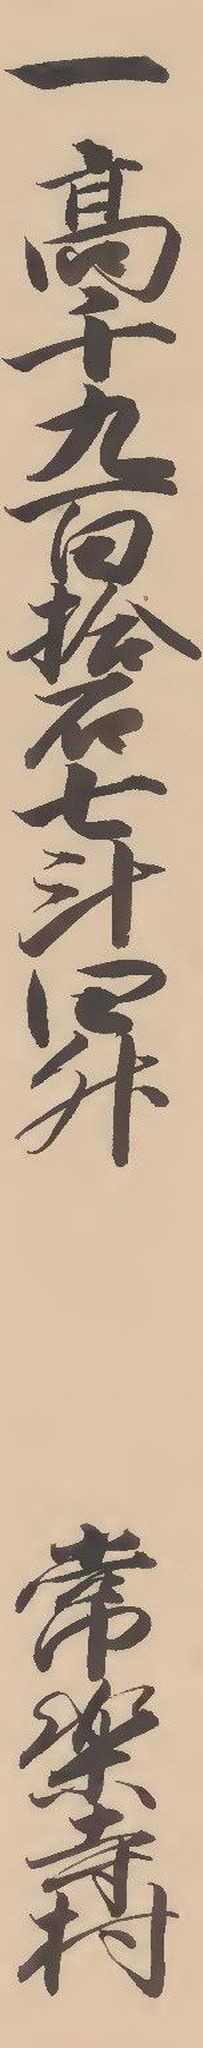一高千九百拾石七斗四升常楽寺村
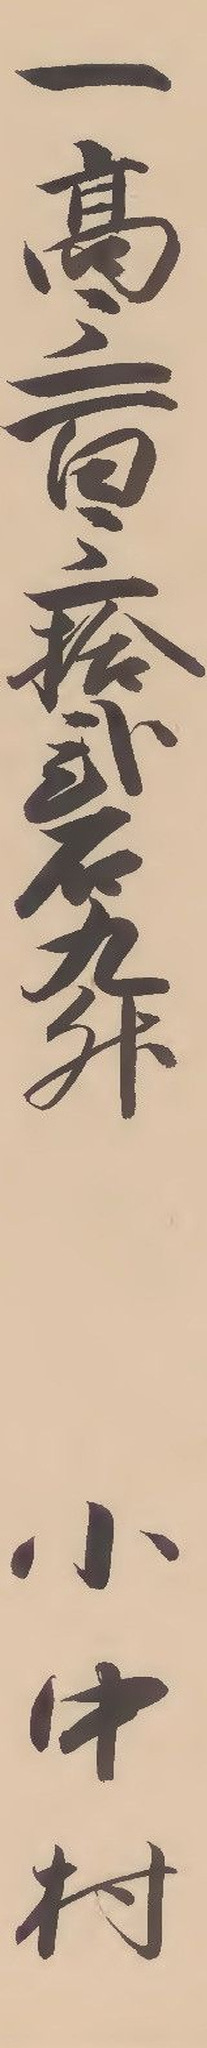一高三百三拾弐石九升小中村
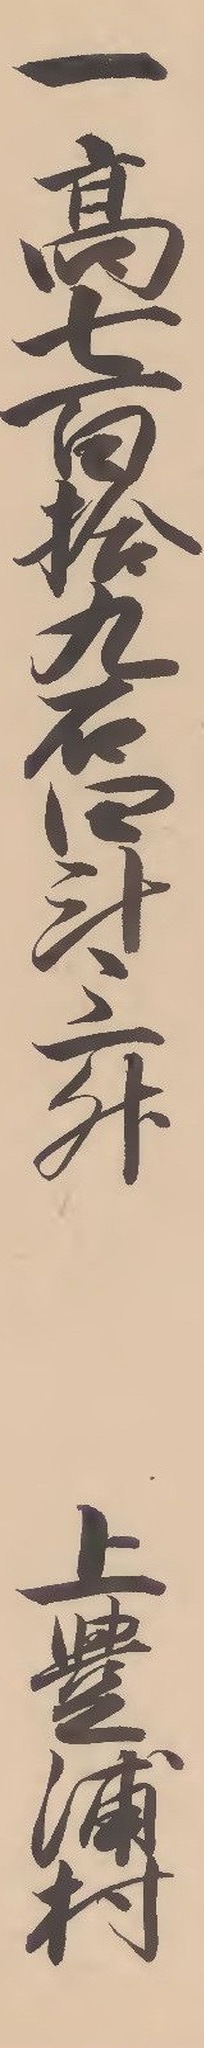一高七百拾九石四斗三升上豊浦村

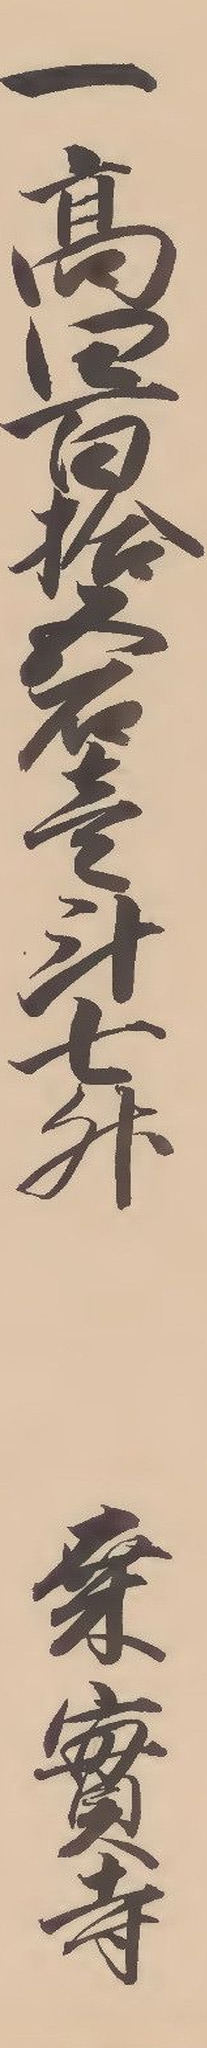一高四百拾五石壱斗七升桑実寺
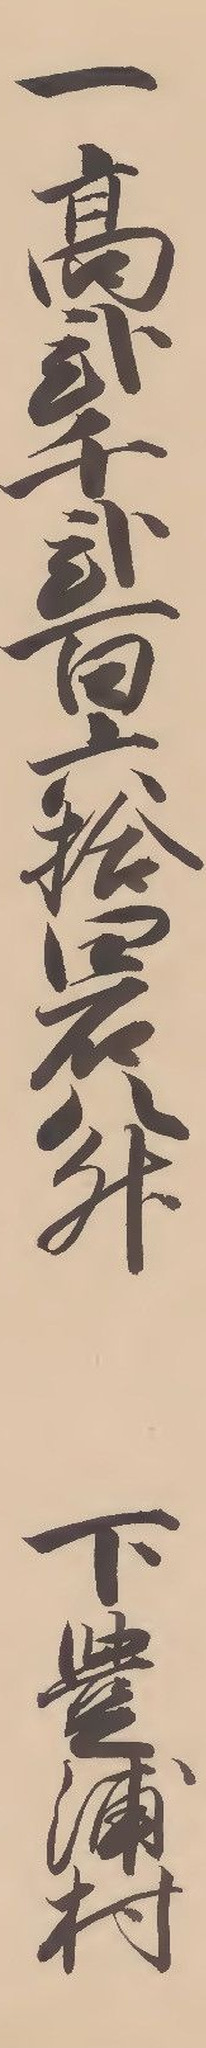一高弐千弐百六拾四石八升下豊浦村
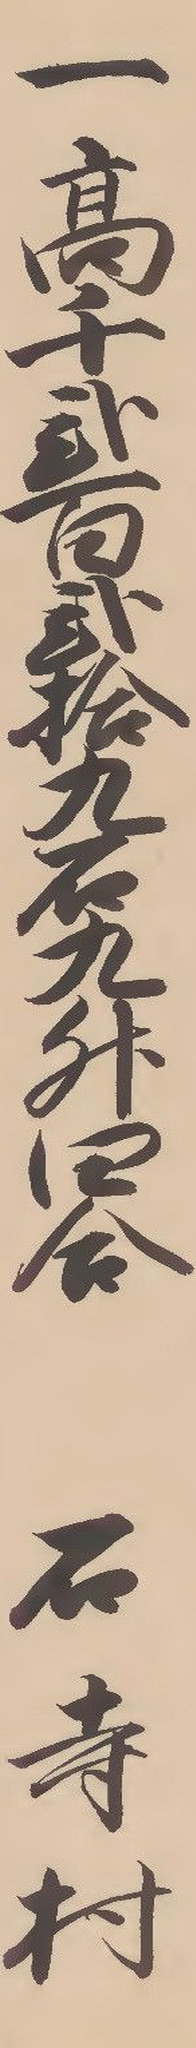一高千弐百弐拾九石九升四合石寺村
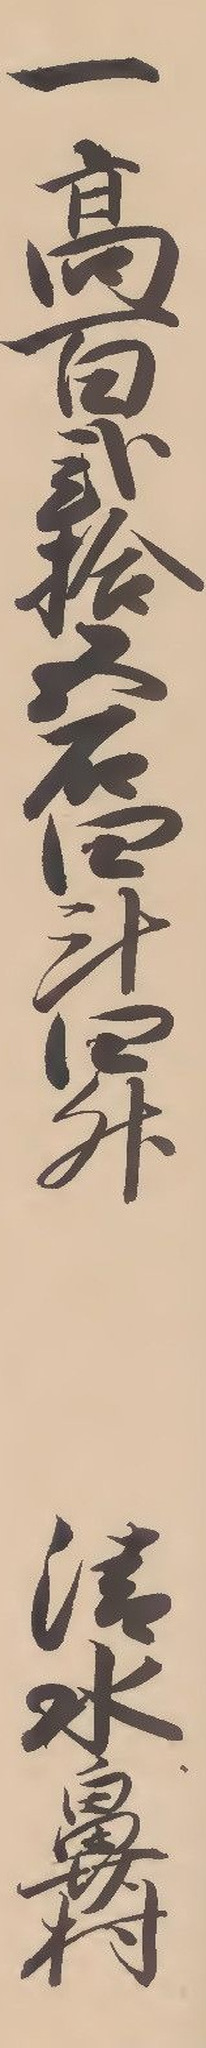一高百弐拾五石四斗四升清水鼻村
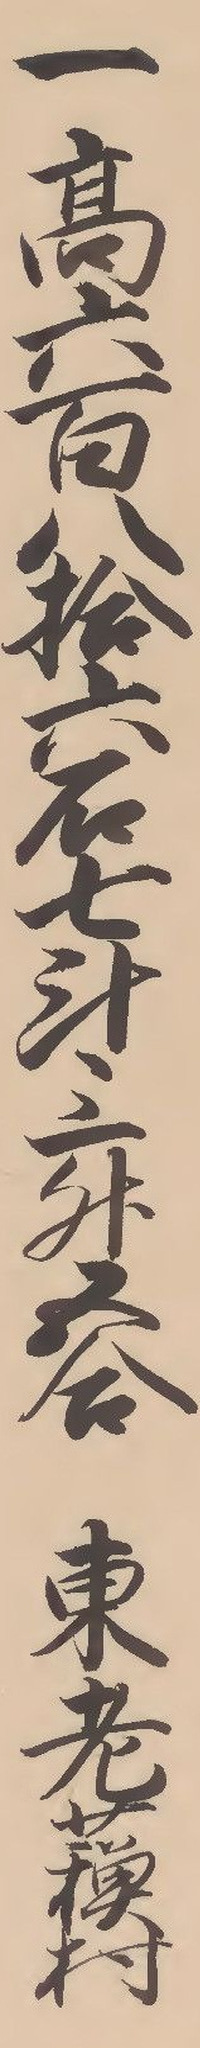一高六百八拾六石七斗三升五合東老蘇村
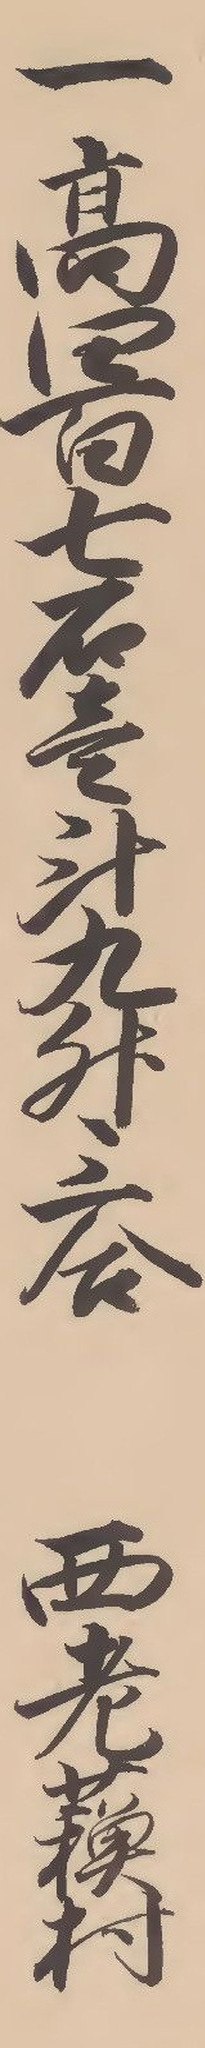一高四百七石壱斗九升三合西老蘇村
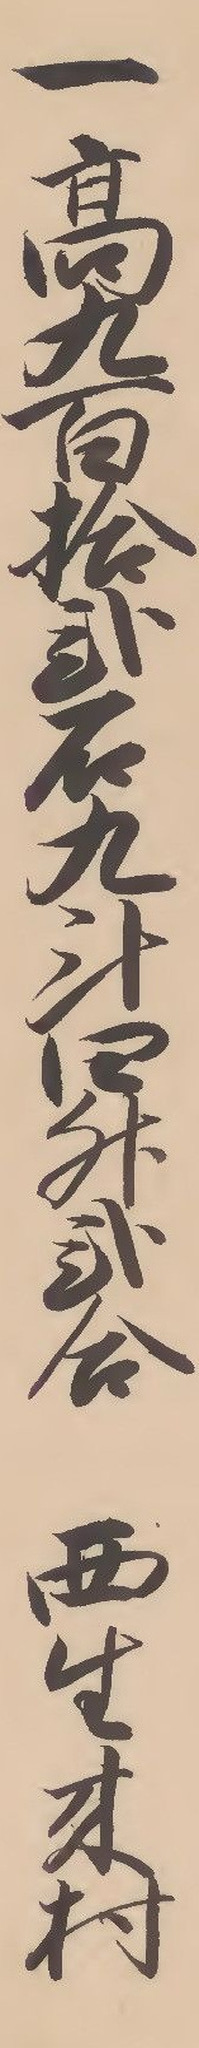一高九百拾弐石九斗四升弐合西生来村

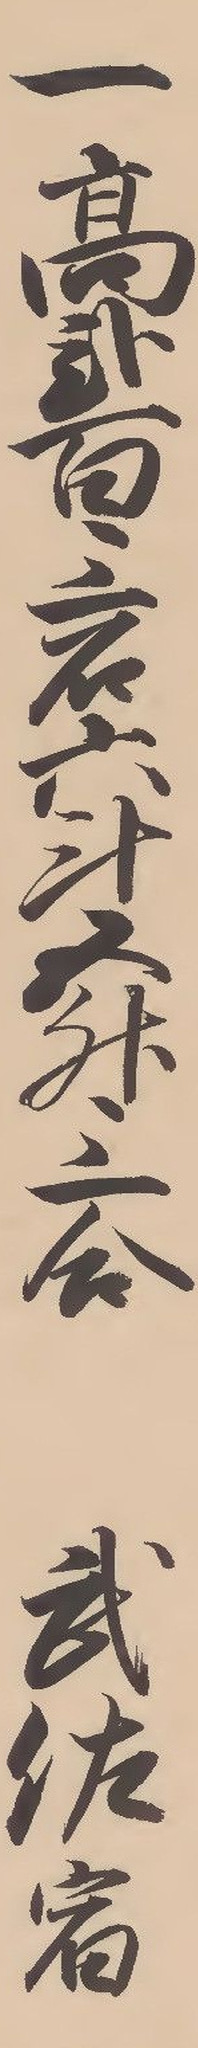一高弐百三石六斗五升三合武佐宿
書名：近江国郷帳
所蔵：国立公文書館 National Archives of Japan
